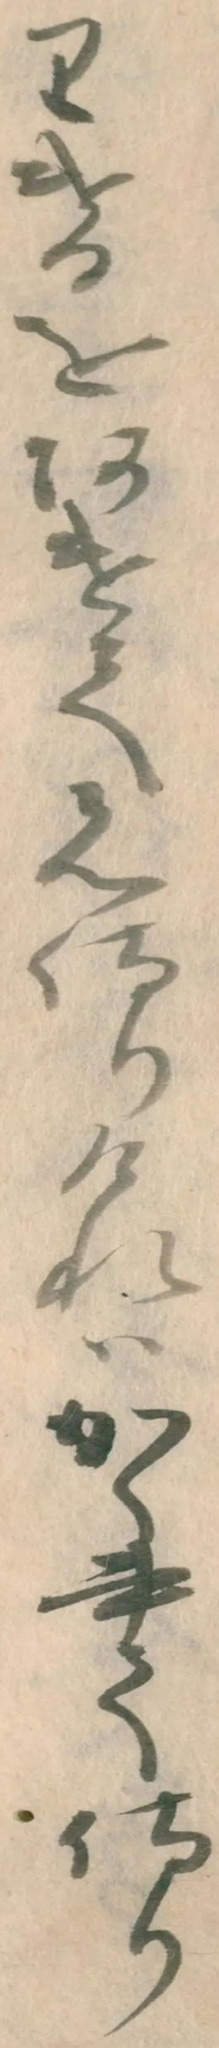りけるをあけて見侍りけれはかく書て侍り
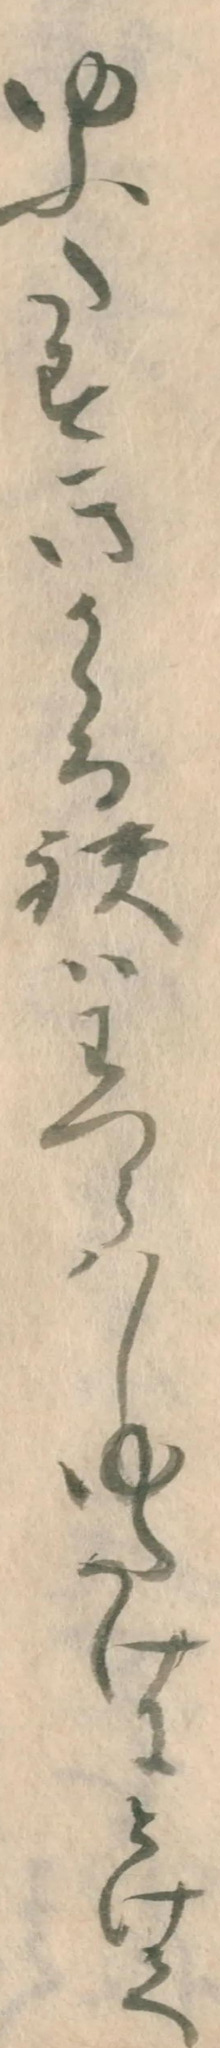ゆふたすきかゝる袂はわつらはしゆたけにとけて
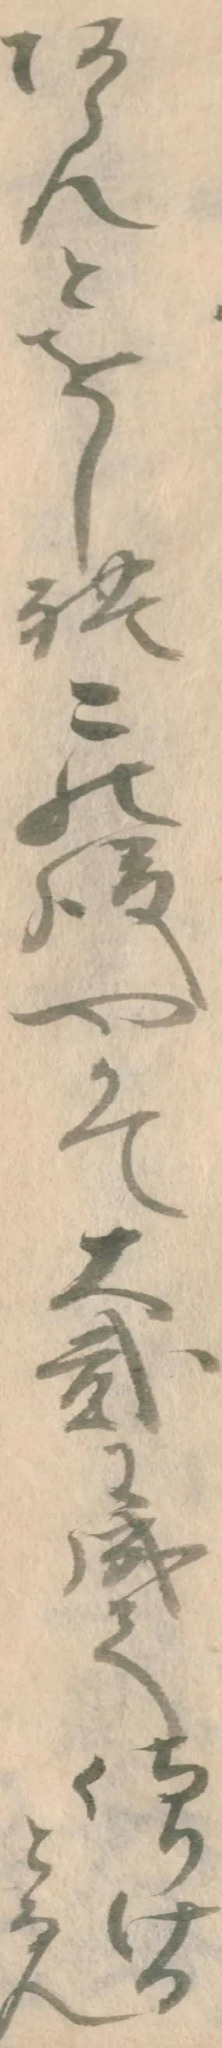あらんとをしれこの後やかて大弐に成て侍りけるとなん
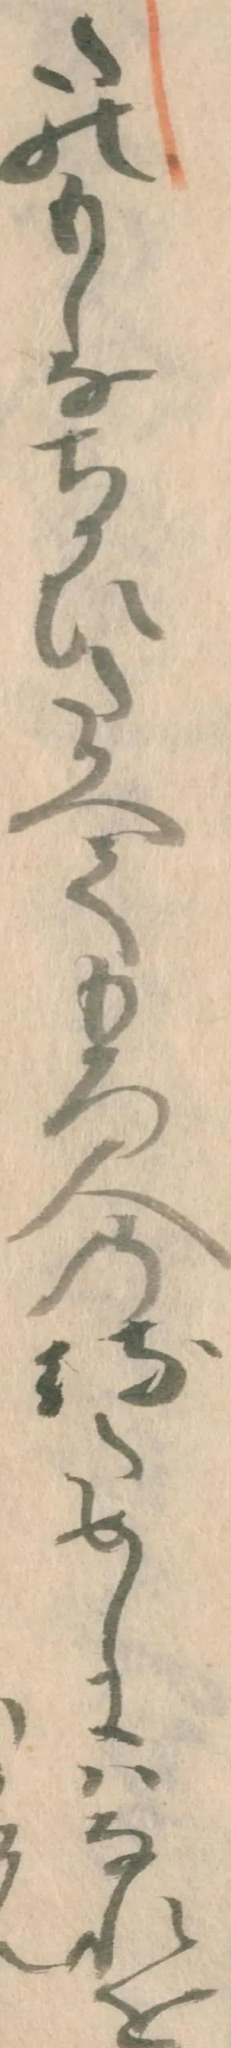たのもしなちかひたかへてもろ人の待ためしにはなれをひかせん
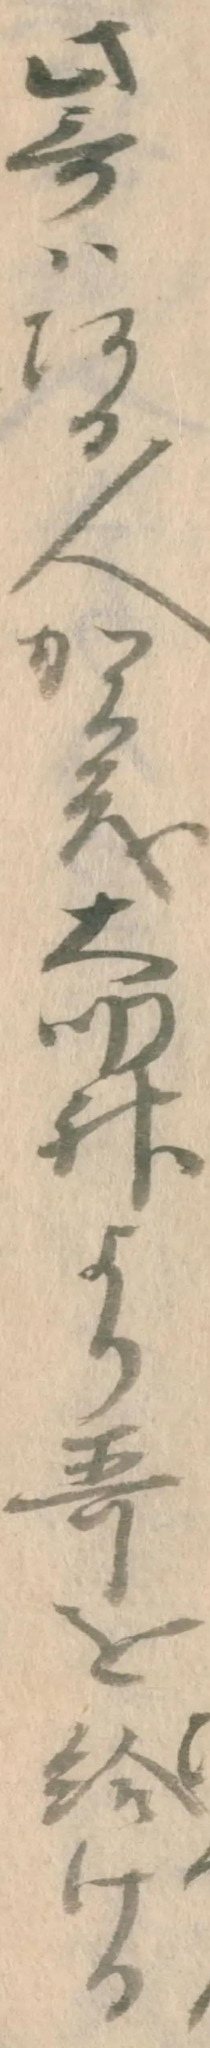此哥はある人賀茂大明神より哥を給ける
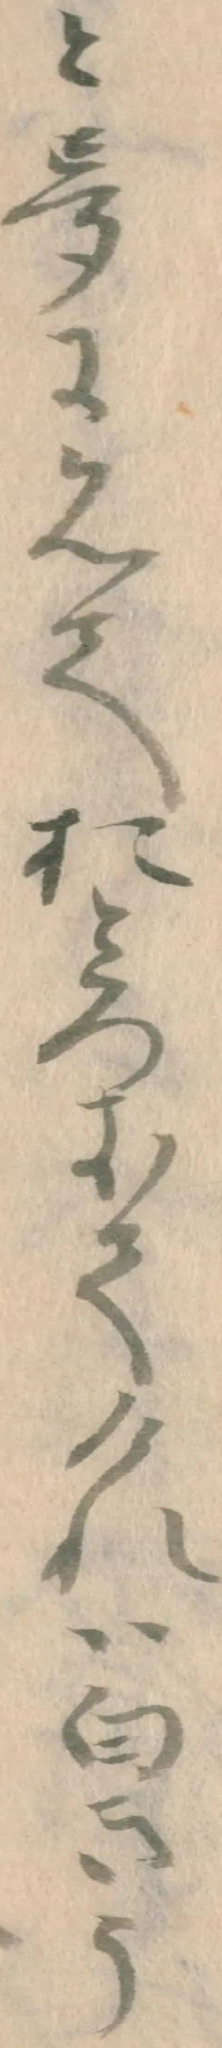と夢に見ておとろきてけれは白きう
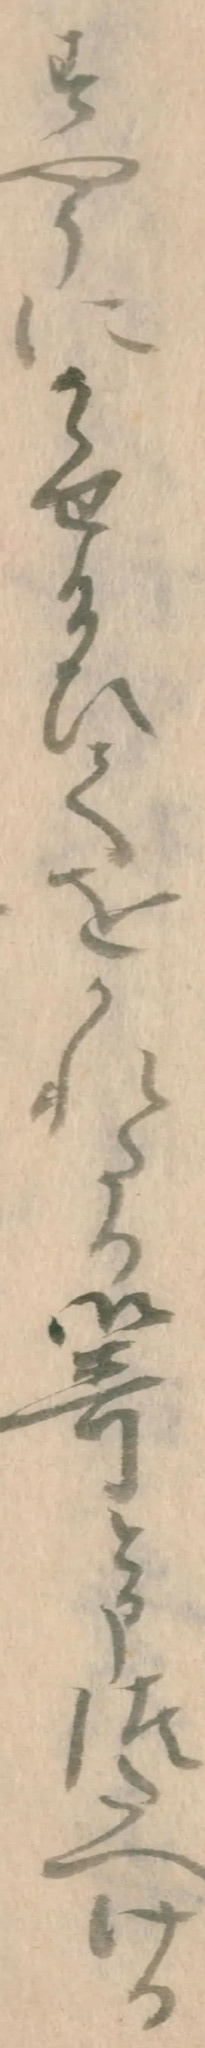すやうにかゝせ給ひてをかれたる御哥と申つたへける
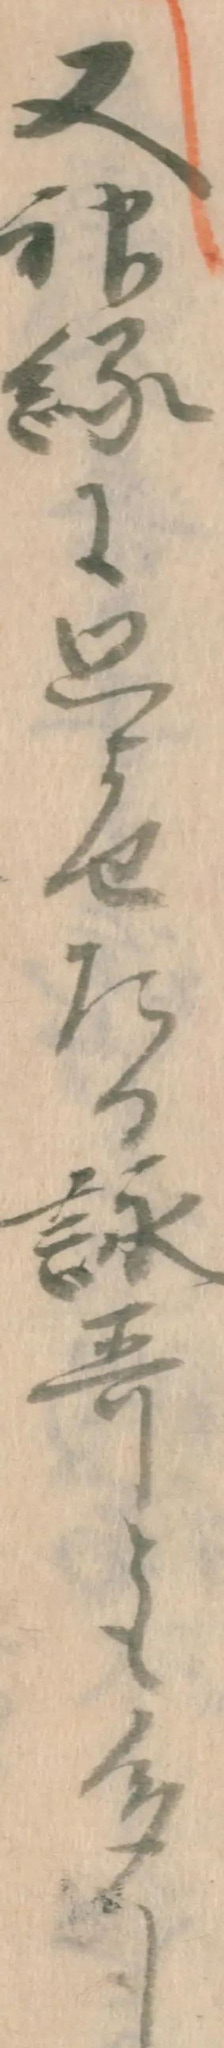又神縁に思よせたる詠哥とも多し
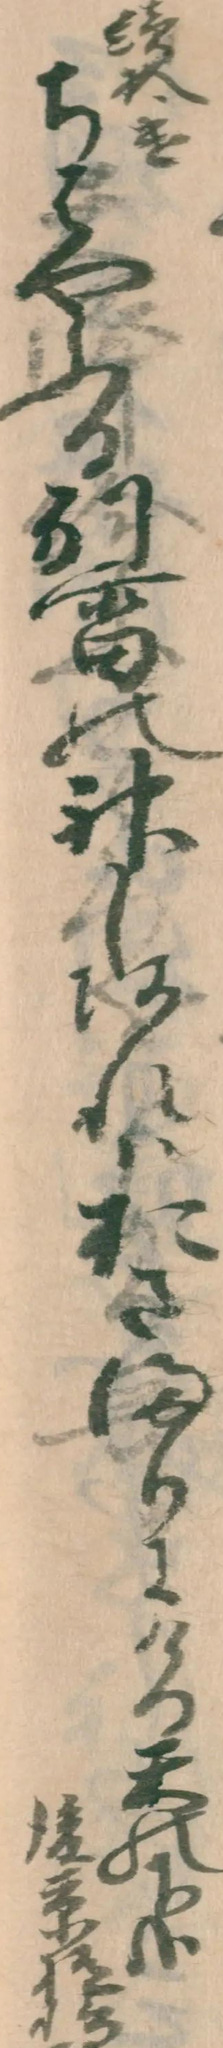ちはやふる別雷の神しあれはおさまりにける天の下哉
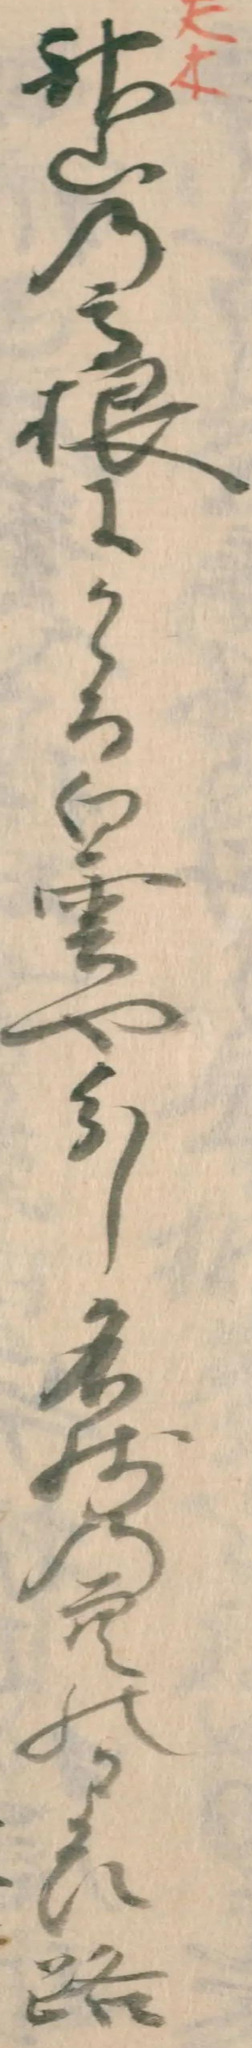神山の高根にかゝる白雲や分し名残の空のかよひ路
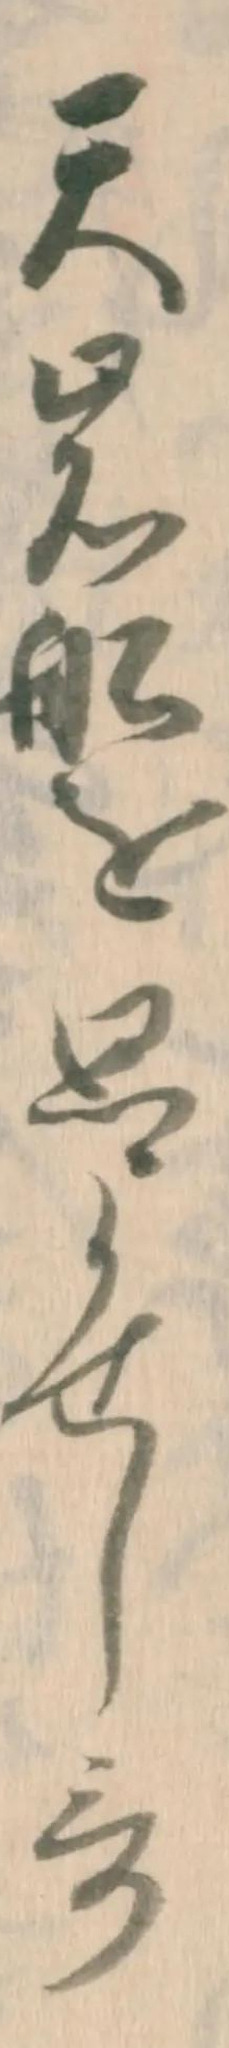天岩船を思よせし哥
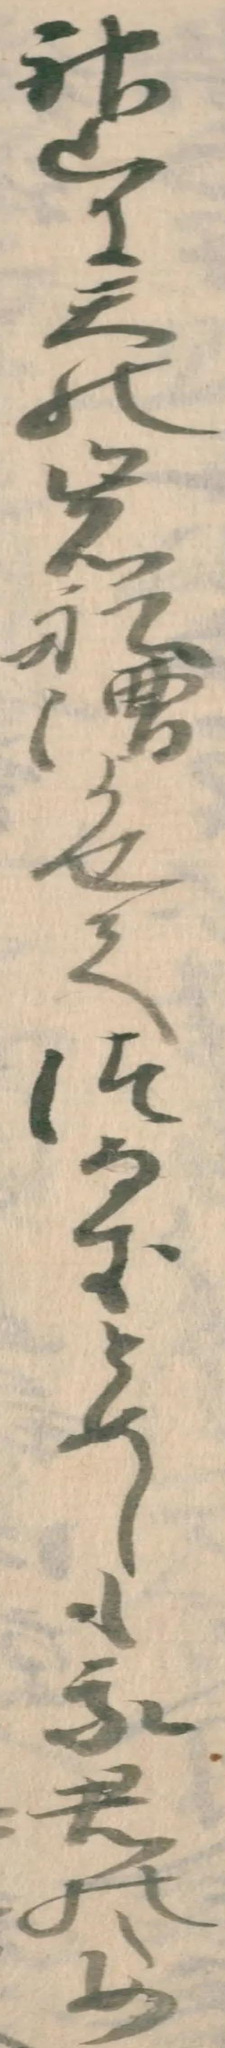神山に天の岩船漕よせてつなきとめしも我君のため
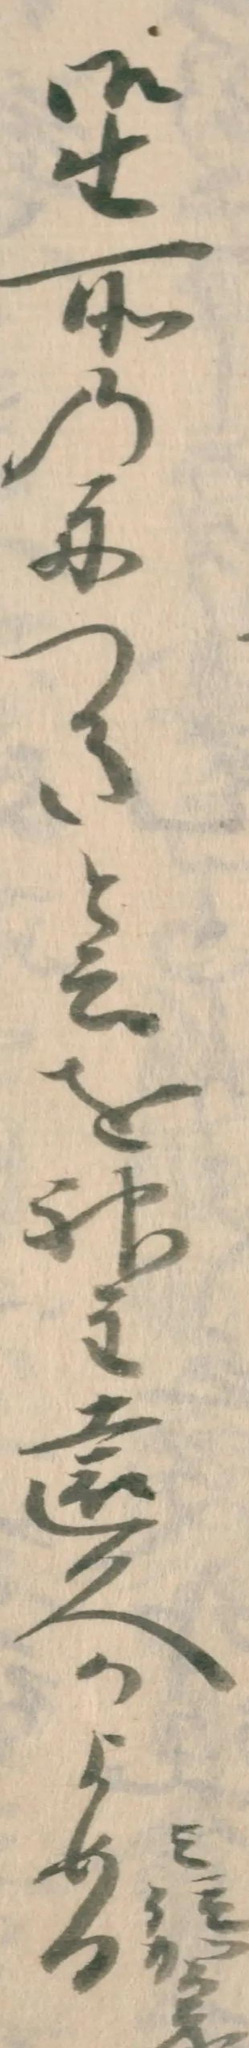御生所の舟つきと云を神主遠久かよめる
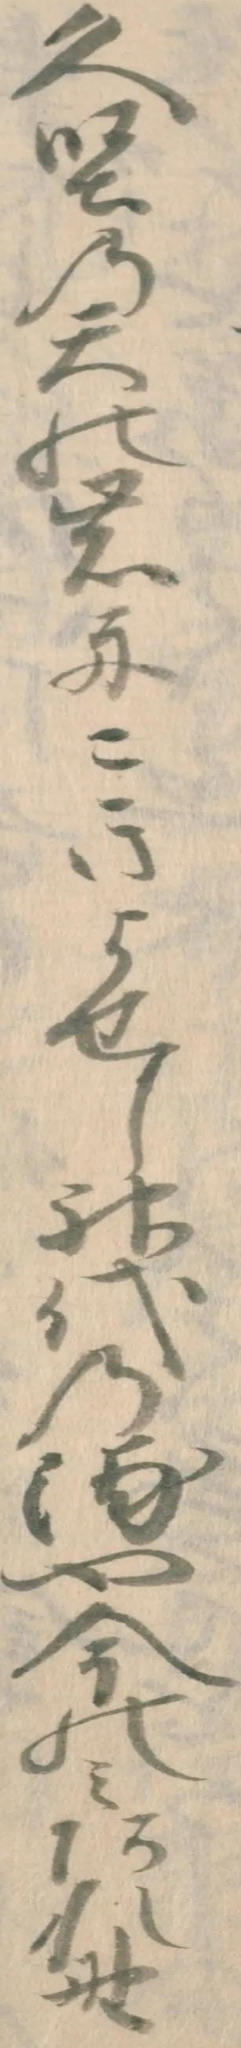久堅の天の岩舟こきよせし神代の浦や今のみあれ野
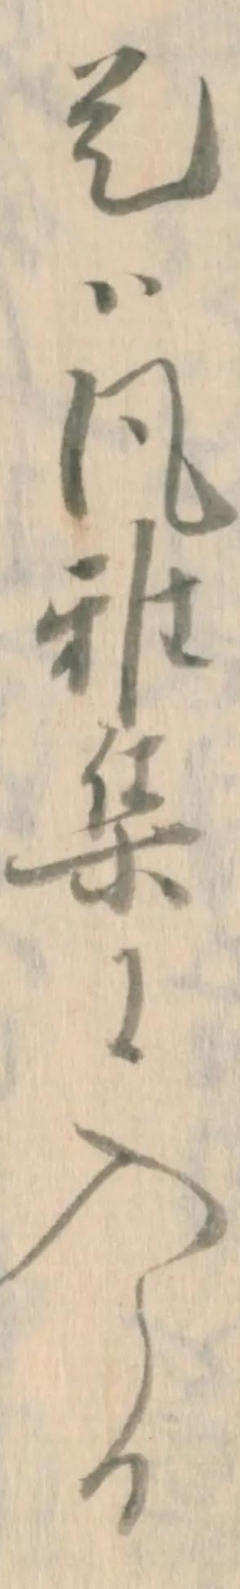是は風雅集に入らる

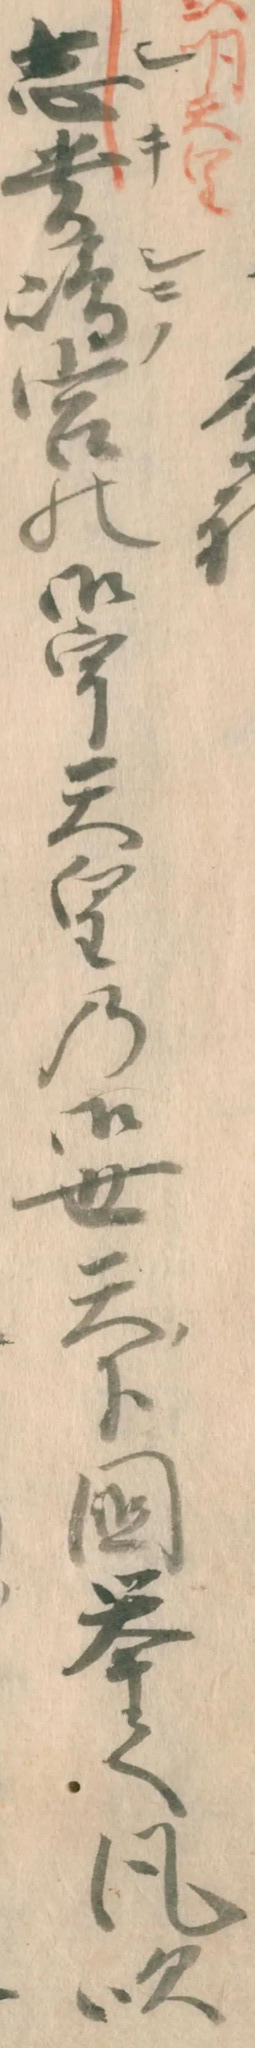志貴嶋宮の御宇天皇の御世天下国挙て風吹
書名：賀茂社記録. 第1冊
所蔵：国立国会図書館 National Diet Library, JAPAN
